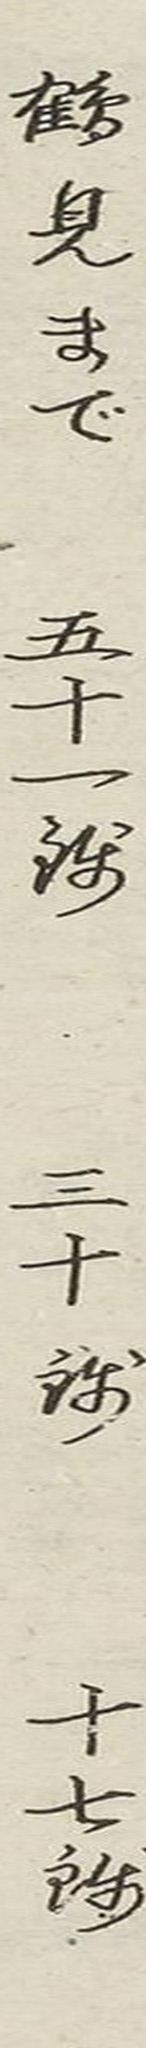鶴見まで五十一銭三十銭十七銭
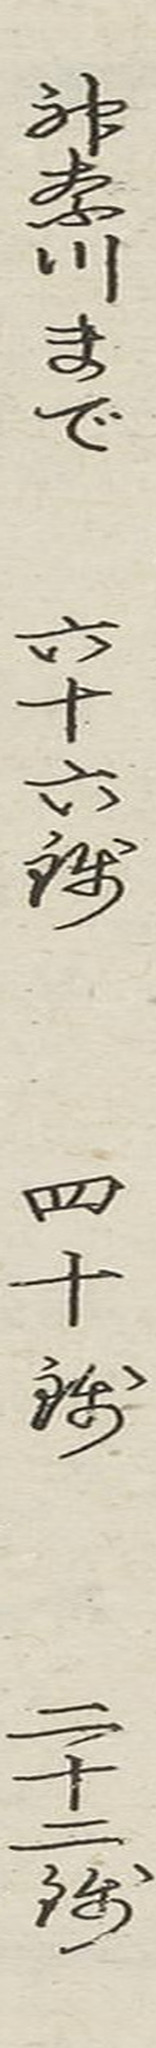神奈川まで六十六銭四十銭二十二銭
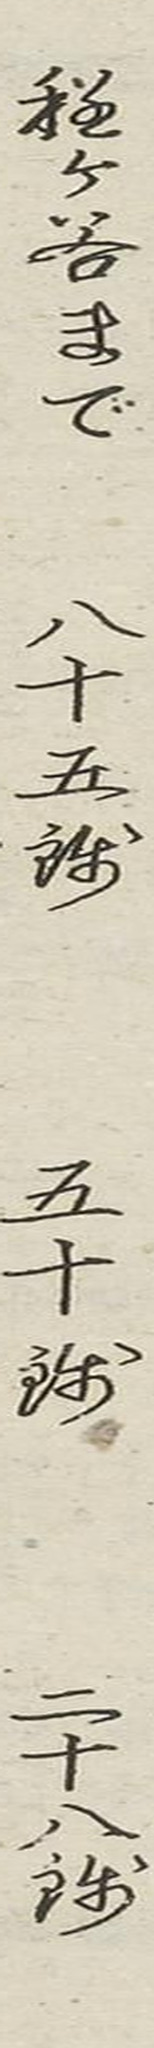穂ヶ谷まで八十五銭五十銭二十八銭
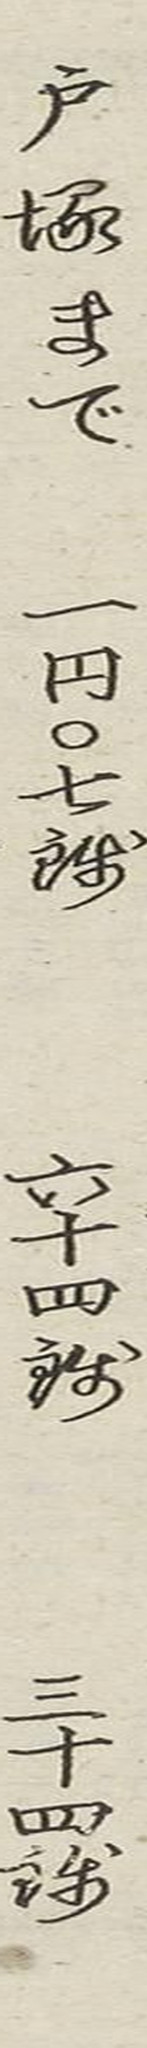戸塚まで一円七銭六十四銭三十四銭
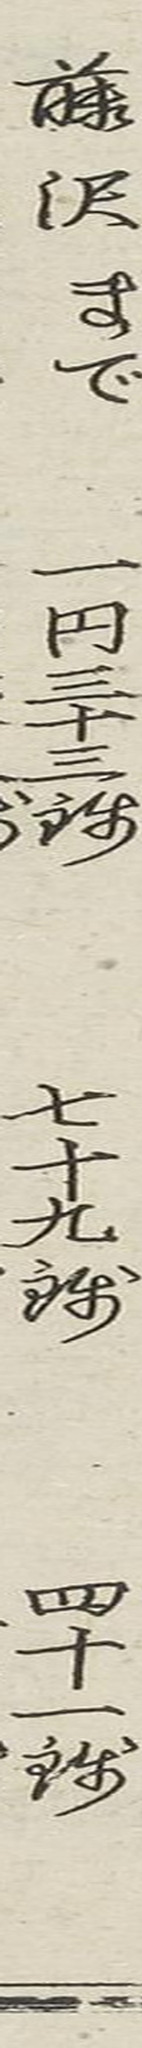藤沢まで一円三十三銭七十九銭四十一銭
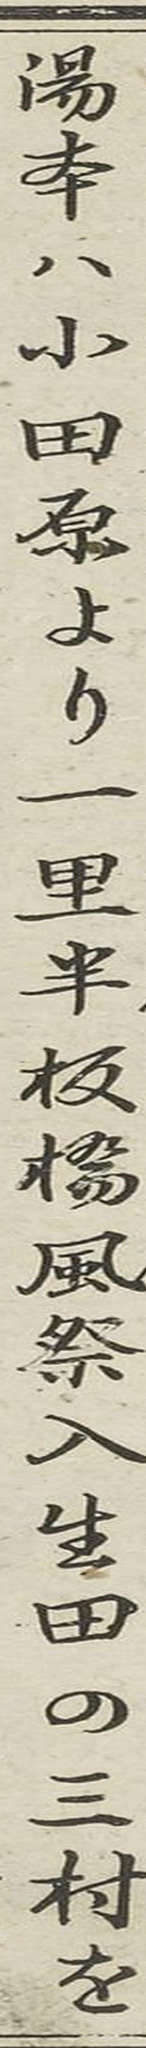湯本は小田原より一里半板橋風祭入生田の三村を
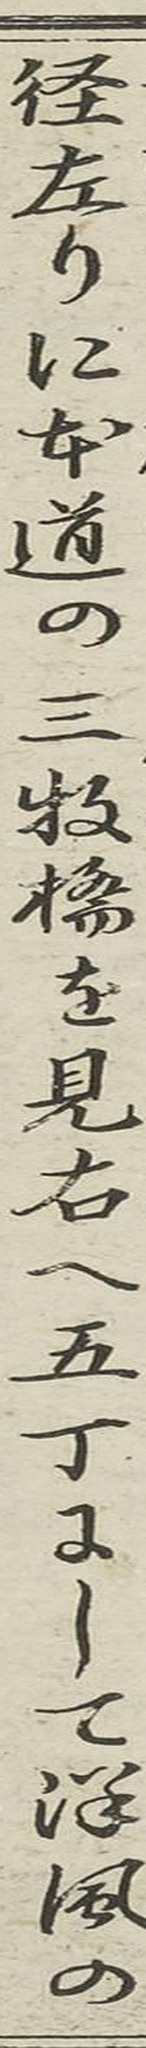経左りに本道の三枚橋を見右へ五丁にして洋風の

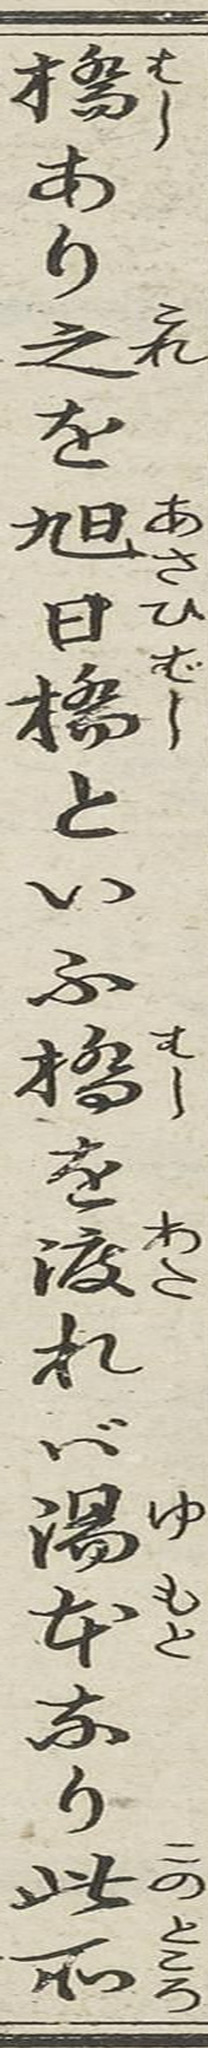橋あり之を旭日橋という橋を渡れば湯本なり此所
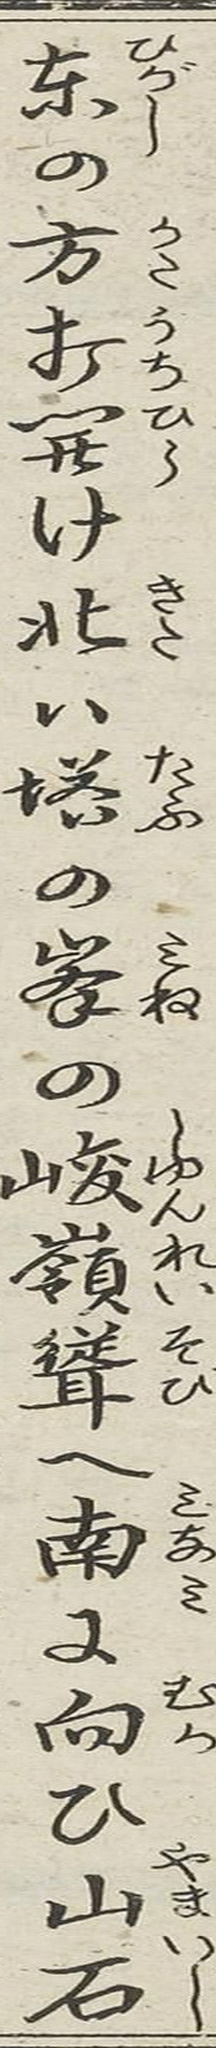東の方打開け北は塔の峯の峻嶺聳え南に向い山石
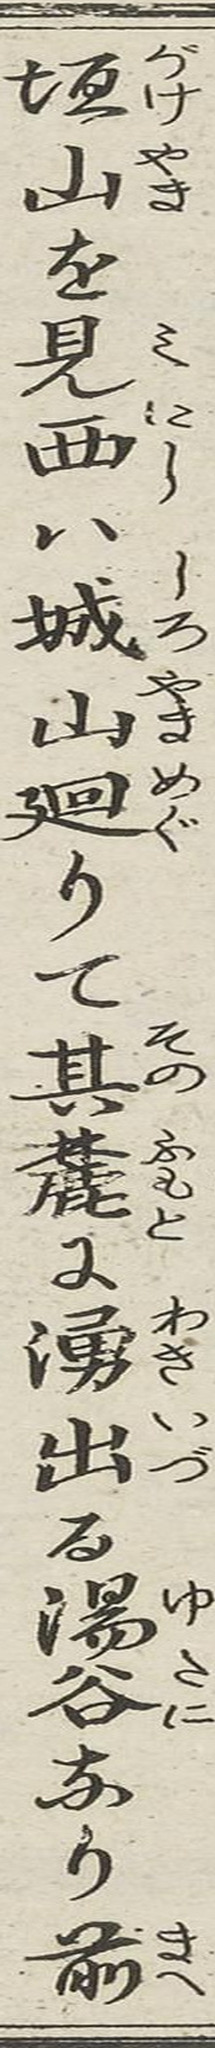垣山を見西は城山廻りて其麓に湧出る湯谷なり前
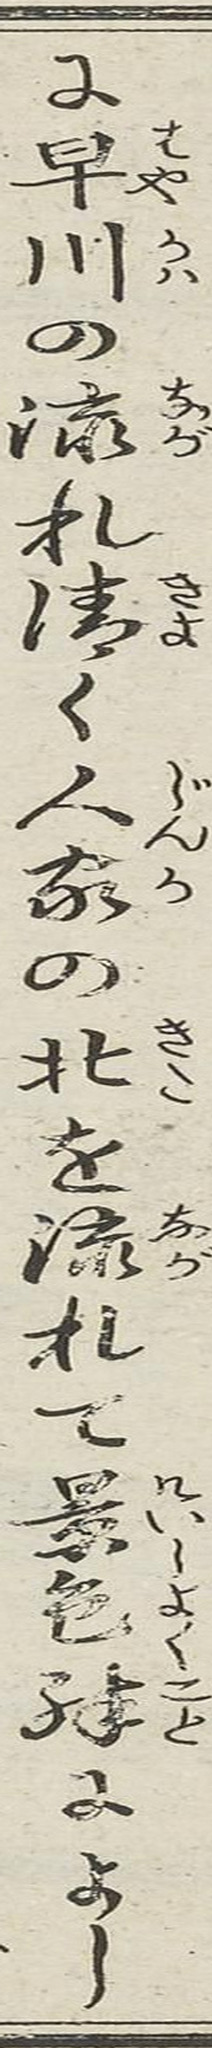に早川の流れ清く人家の北を流れて景色殊によし
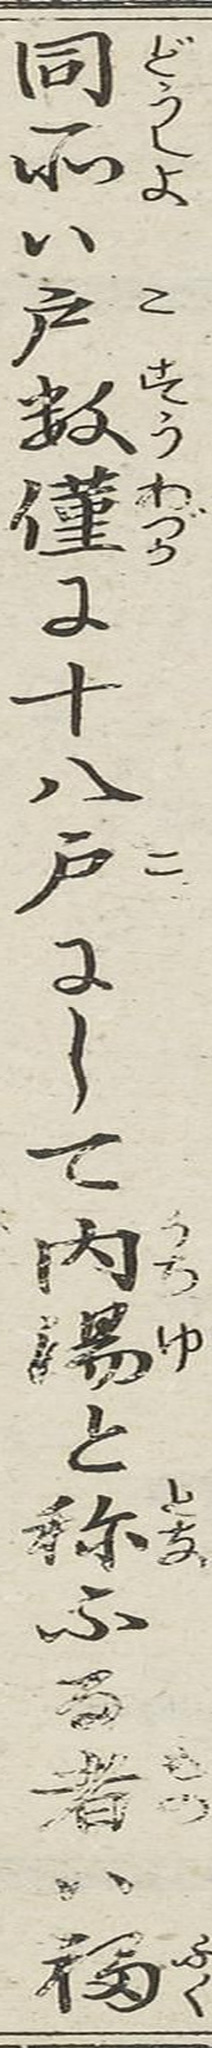同所は戸数僅に十八戸にして内湯と称うる者は福
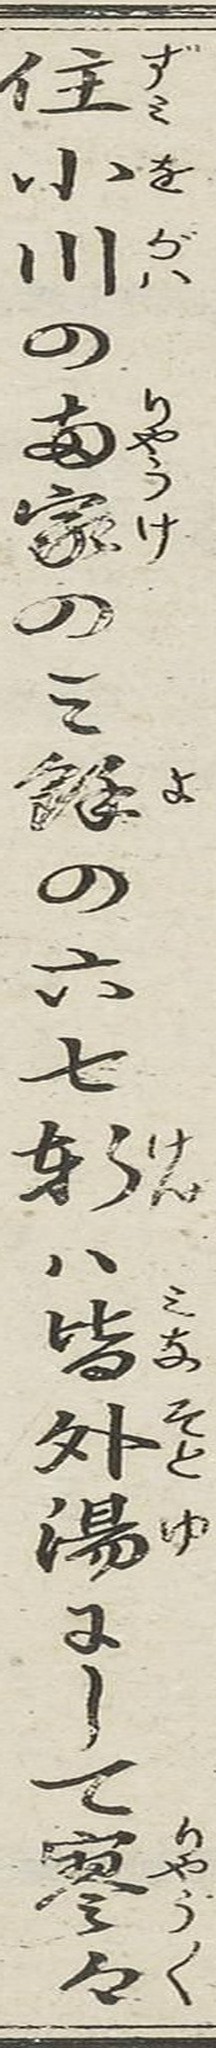住小川の両家のみ餘の六七軒は皆外湯にして寥々
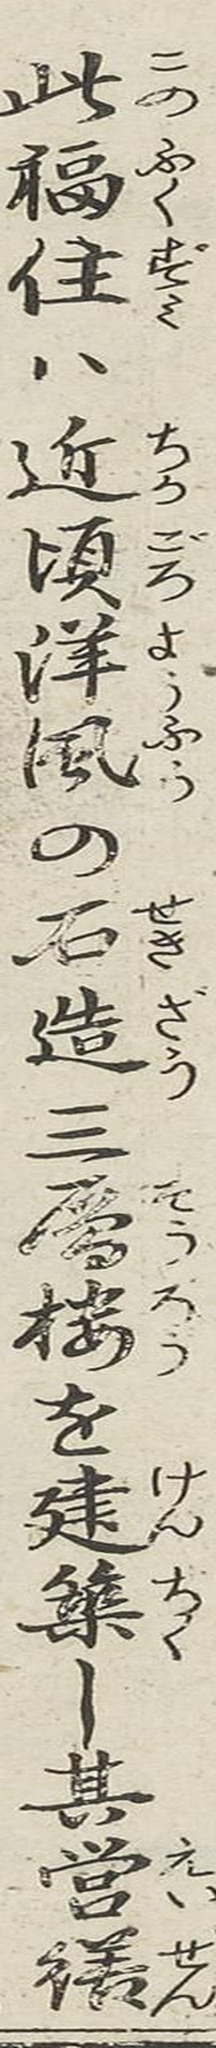此福住は近頃洋風の石造三層楼を建築し其営繕
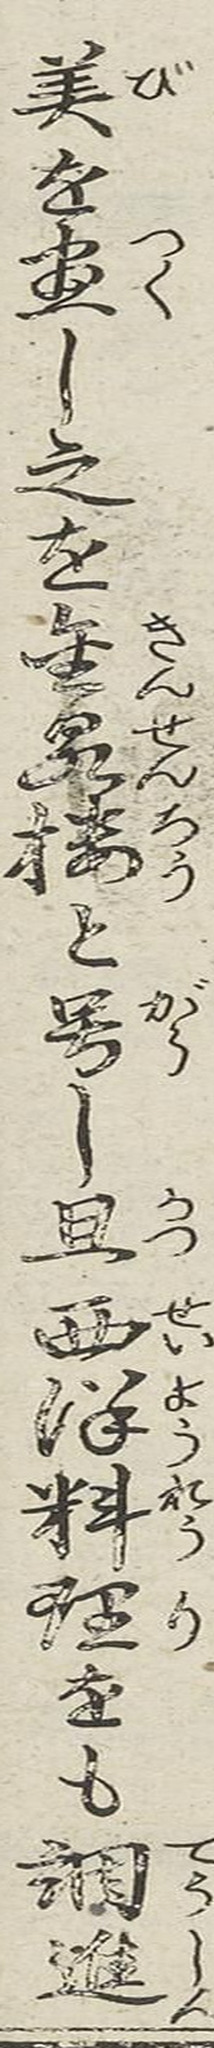美を盡し之を金泉楼と号し且西洋料理をも調進
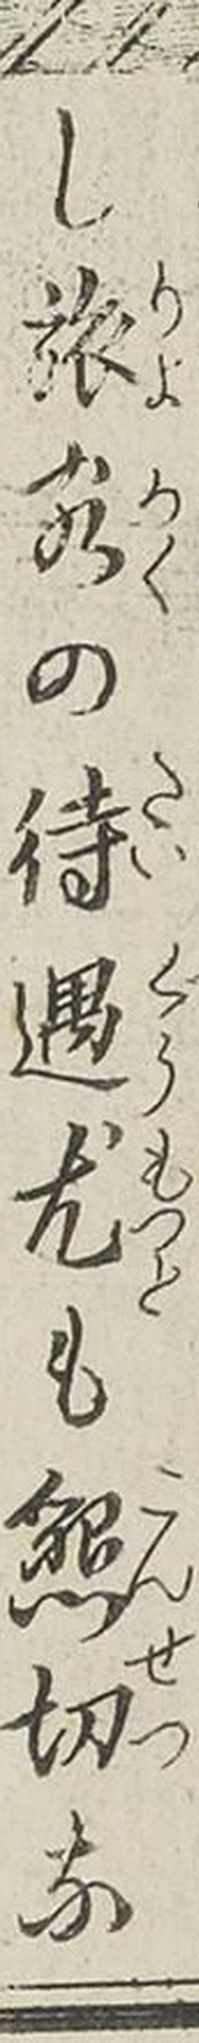し旅客の待遇尤も懇切な
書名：箱根温泉誌　全
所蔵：東京大学地震研究所図書室 Earthquake Research Institute Library, The University of Tokyo, JAPAN
